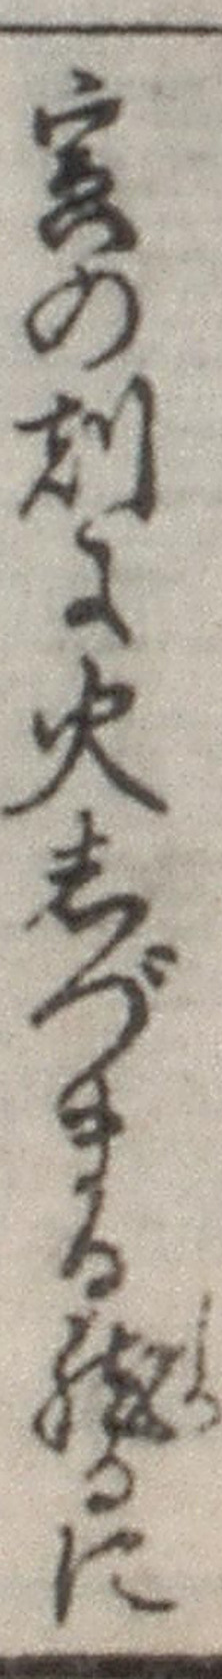寅の刻に火しづまる然るに
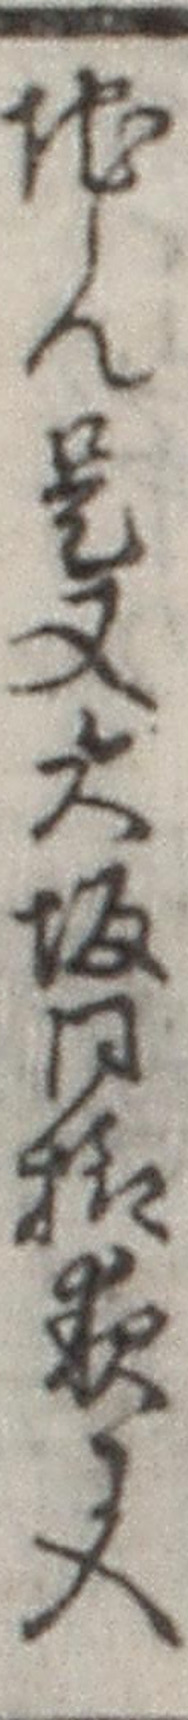地しん是又大坂同様夜に入
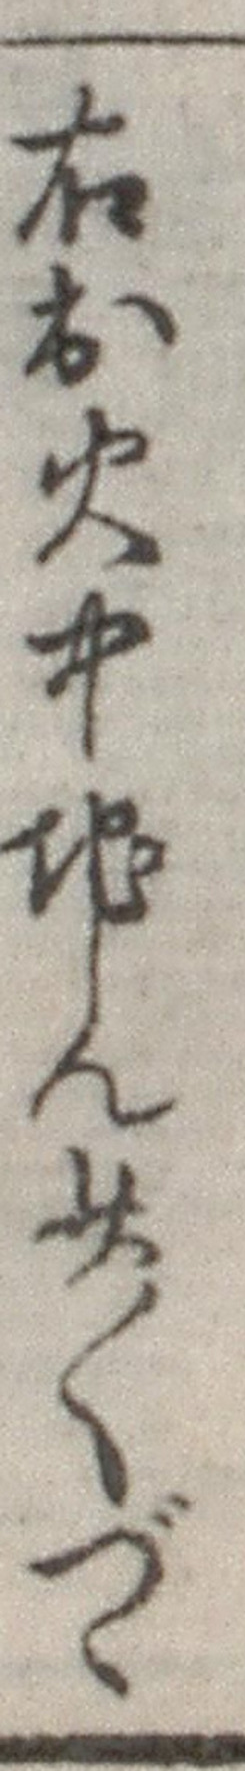右於火中地しん少〳〵づゝ
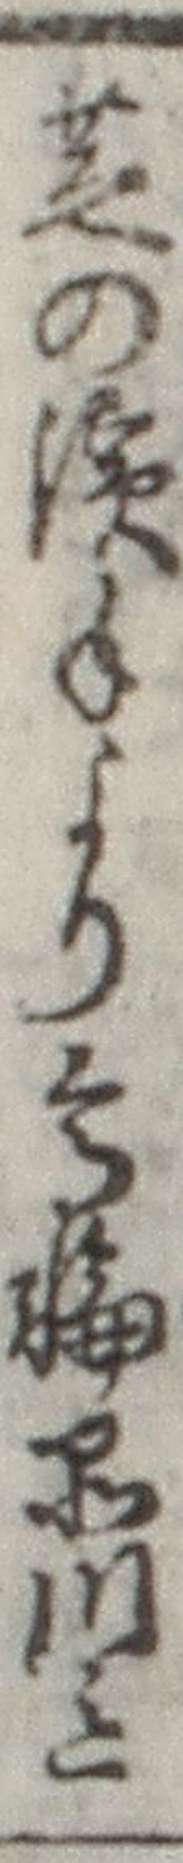芝の浜手より高輪品川迄
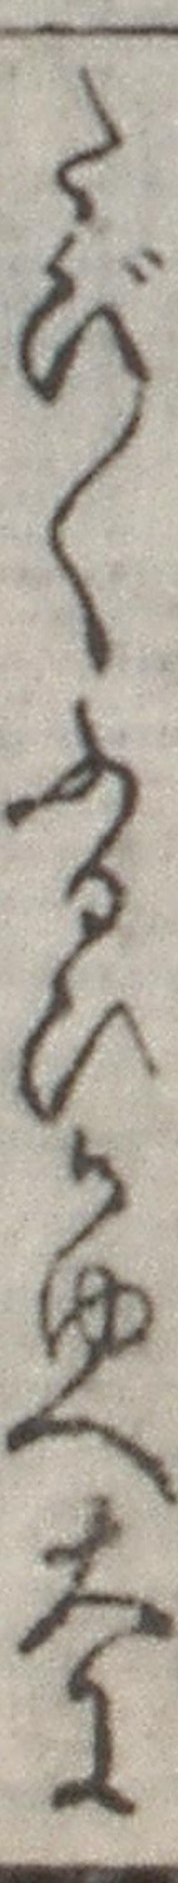たび〳〵ふるひ候ゆへ大に
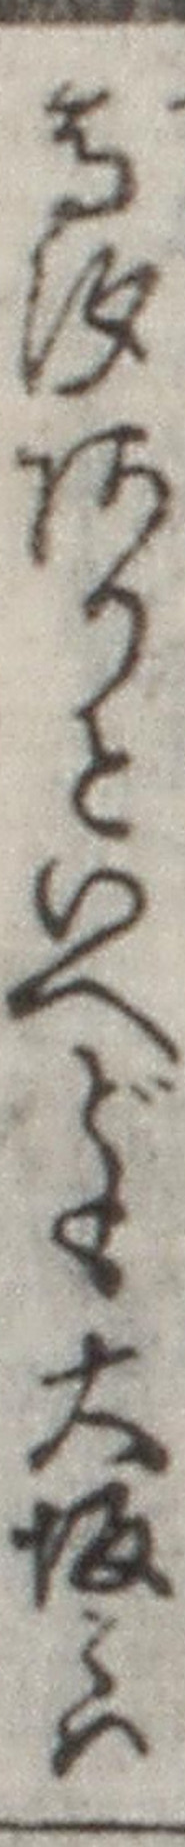高汐ありといへども大坂とは
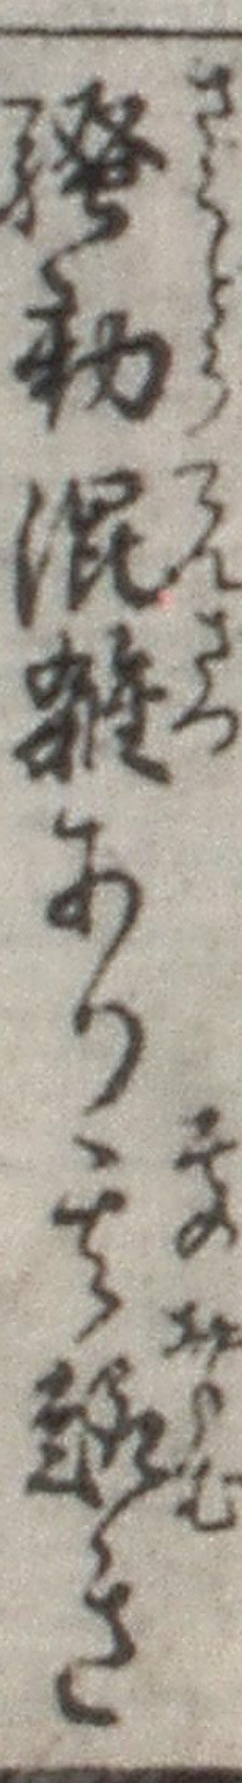騒動混雑あり其趣き
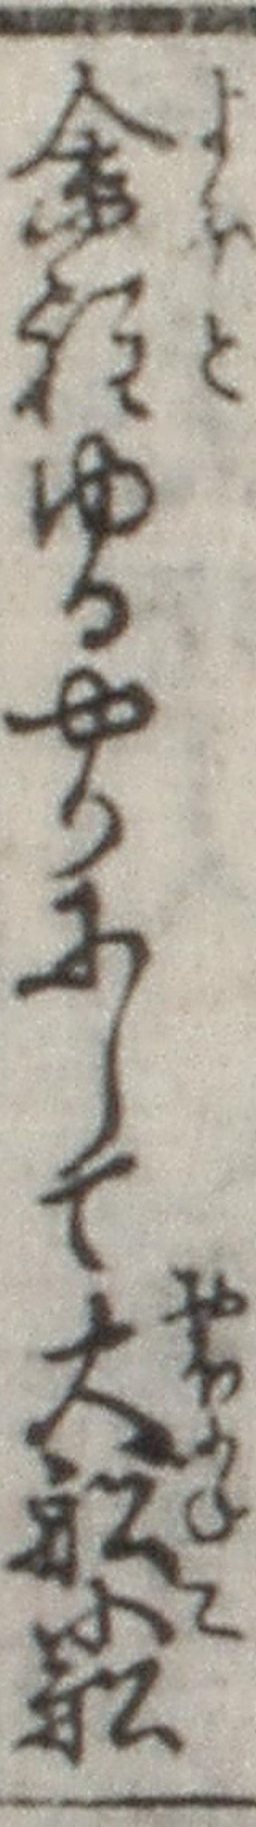余程ゆるやかにして大舩小舩
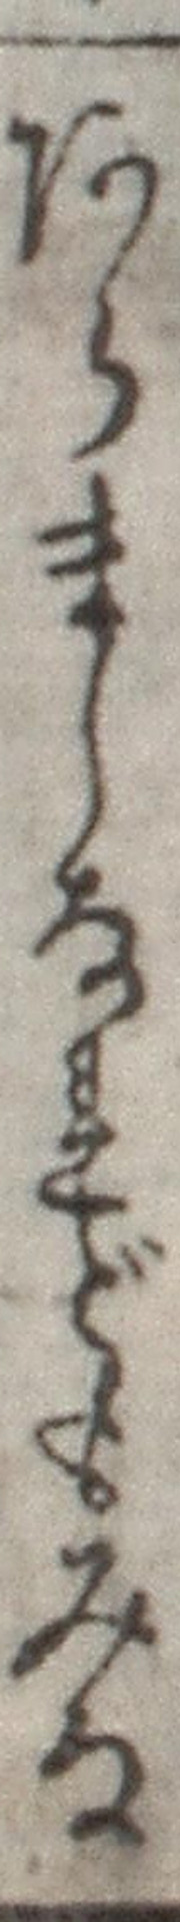あらましなれどもみな
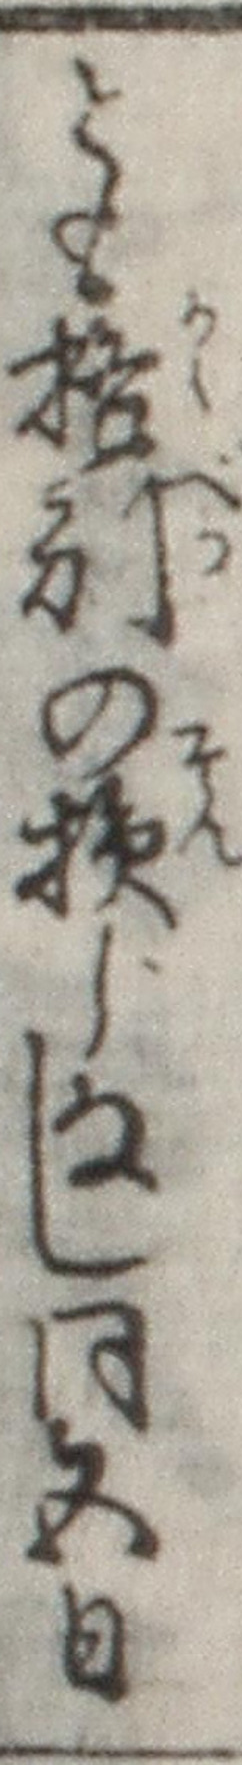とも格別の損じなし同五日
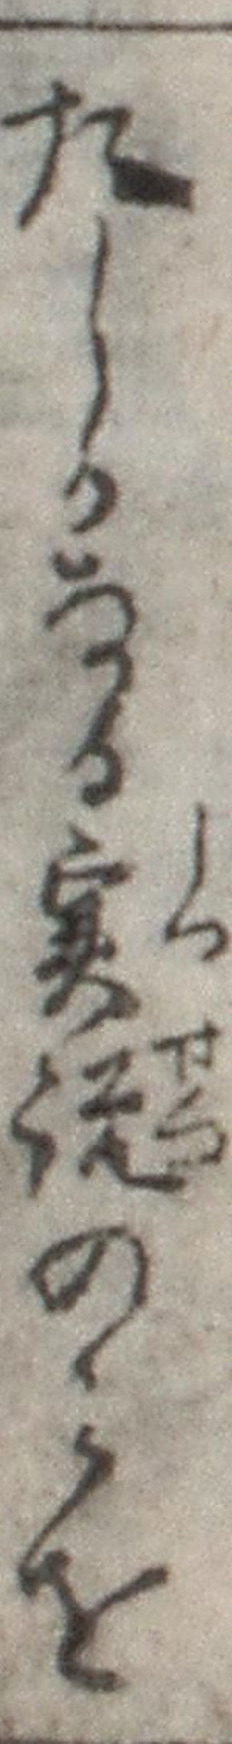たしかなる実説のみを
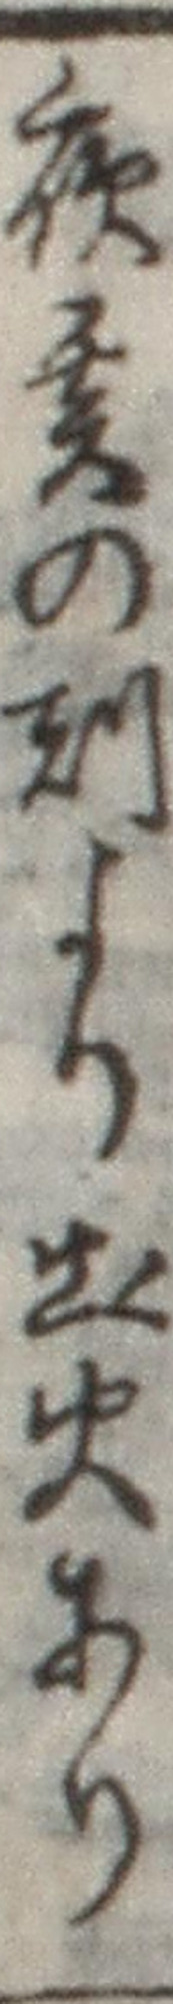夜亥の刻より出火あり
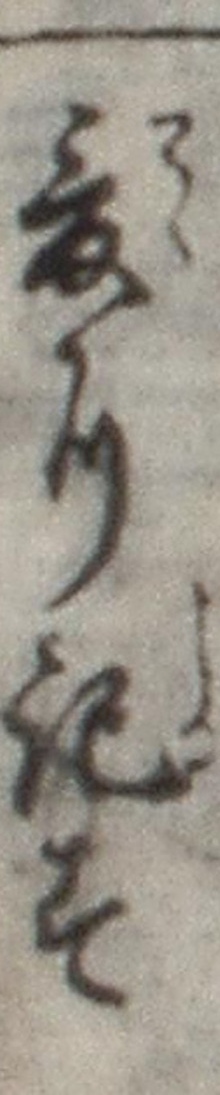爰に記す

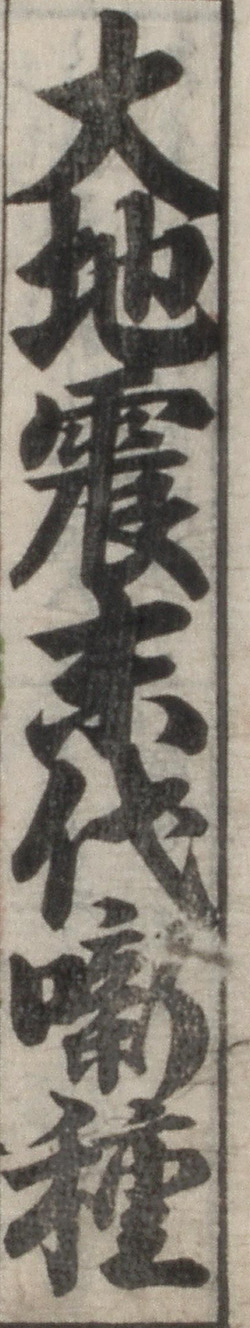大地震末代噺種
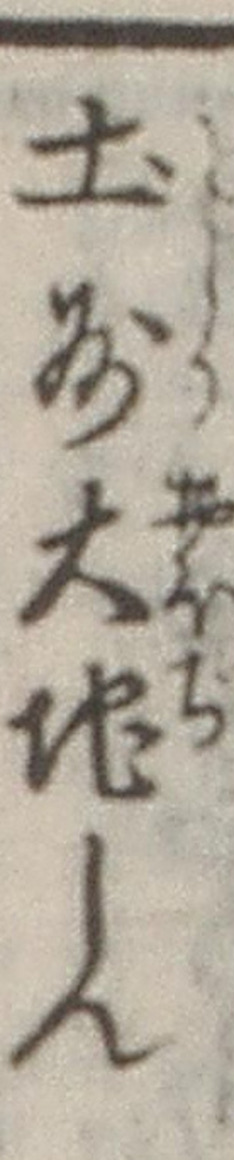土州大地しん
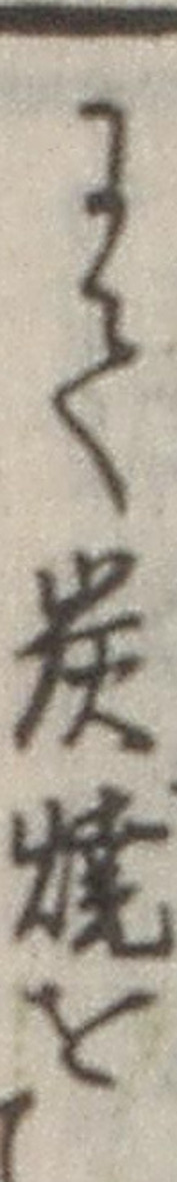にて炭焼を
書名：諸國大地震年代記　末代噺種
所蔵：東京大学地震研究所図書室 Earthquake Research Institute Library, The University of Tokyo, JAPAN
